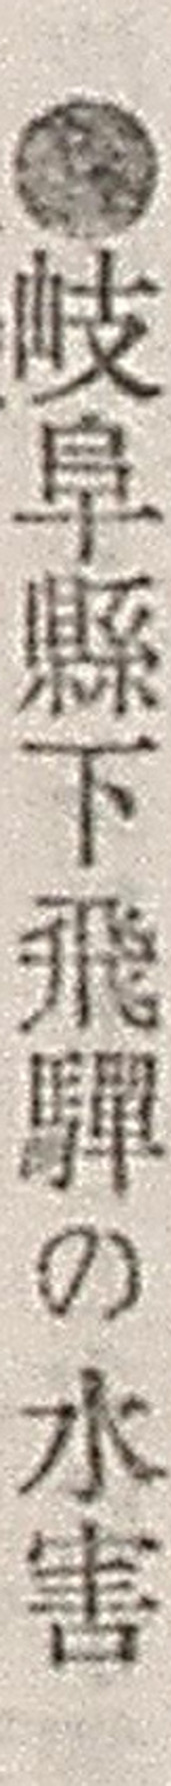●飛騨県下飛騨の水害
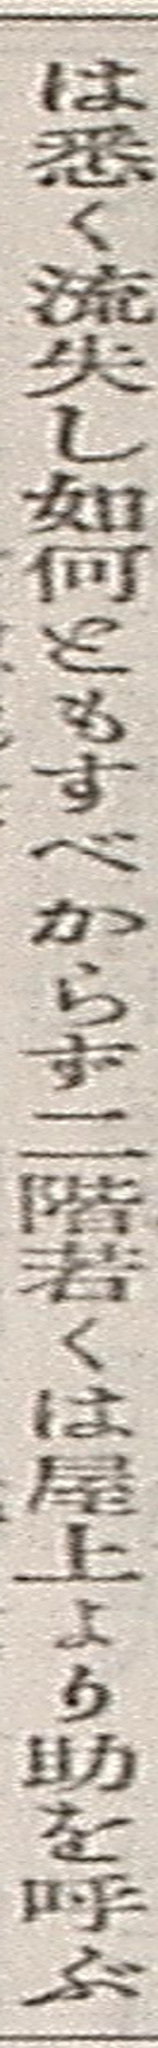は悉く流失し如何ともすべからず二階若くは屋上より助を呼ぶ
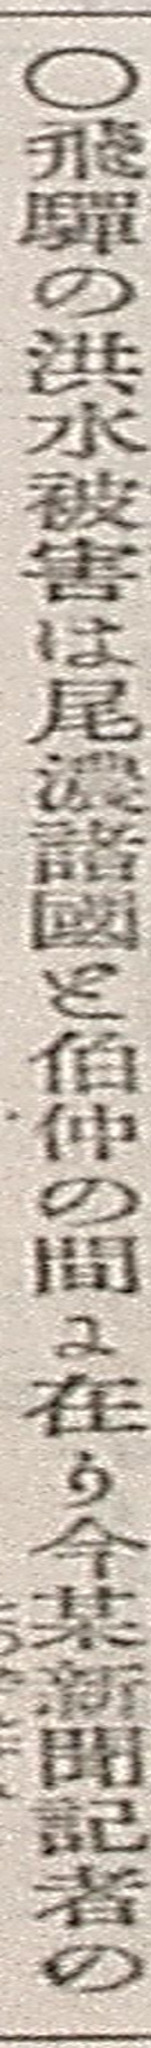◯飛騨の洪水被害は尾濃諸国と伯仲の間に在り今某新聞記者の
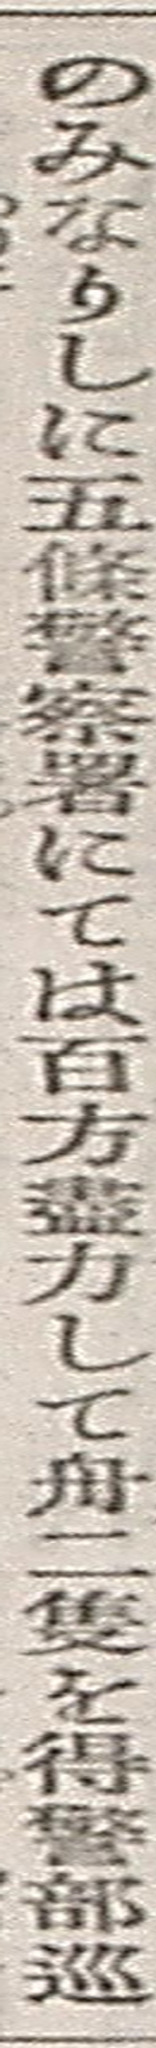のみなりしに五條警察署にては百方盡力して舟二隻を得警部巡
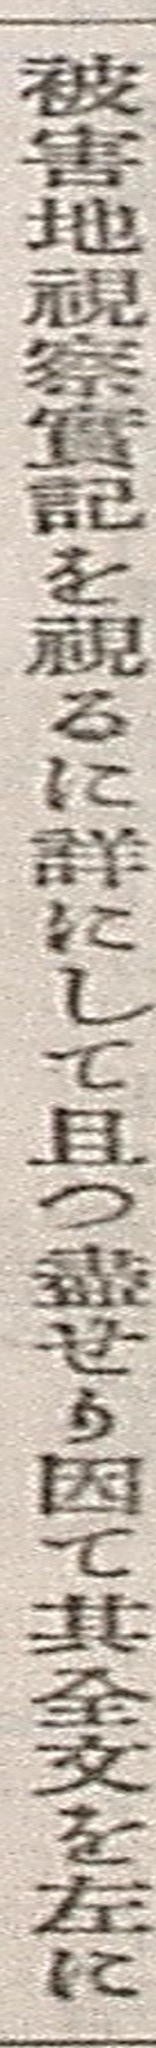被害地視察実記を視るに詳にして且つ盡せり因て其全文を左に
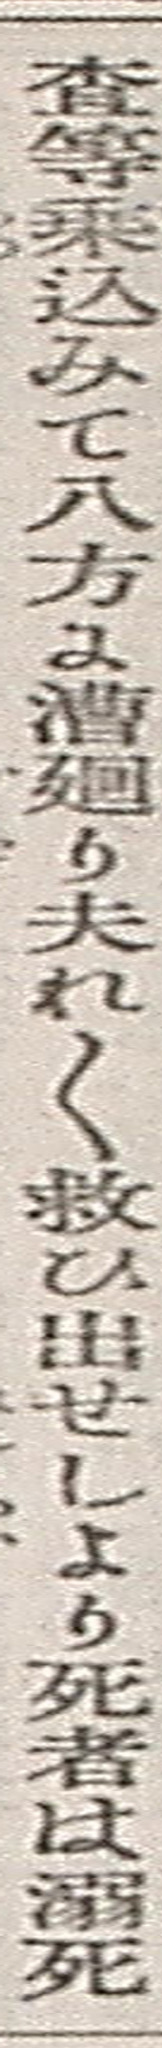査等乗込みて八方に漕廻り夫れ〳〵救ひ出せしより死者は溺死
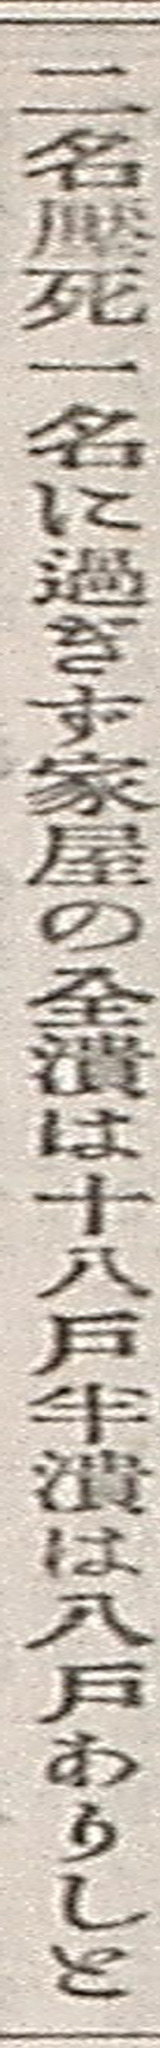二名壓死一名に過ぎず家屋の全潰は十八戸半潰は八戸ありしと
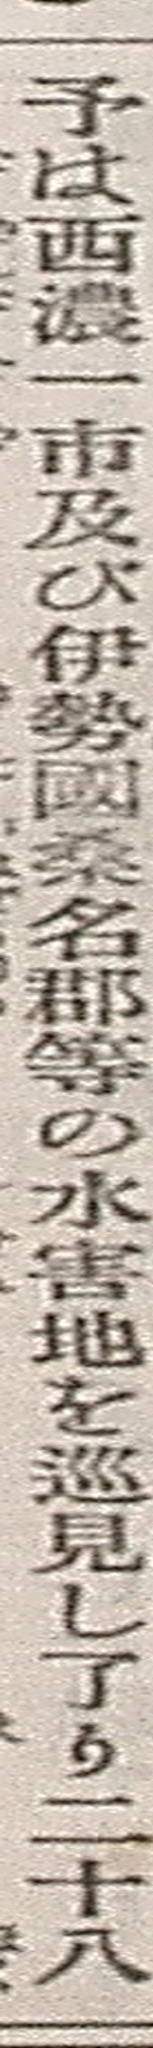予は西濃一市及び伊勢国桑名郡等の水害地を巡見し了り二十八
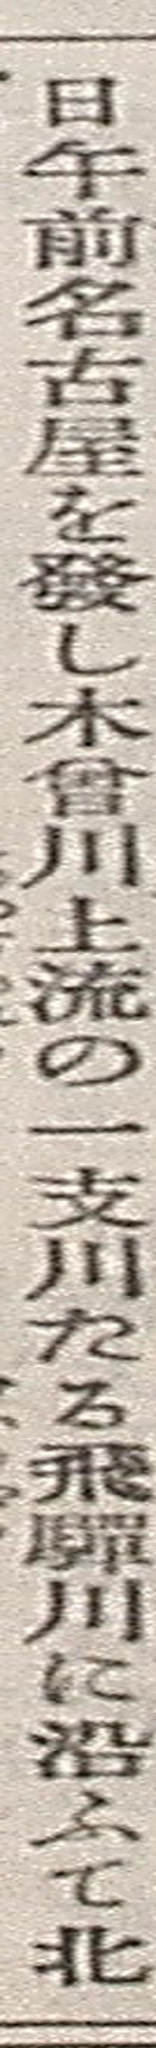日午前名古屋を発し木曽川上流の一支川たる飛騨川に沿ふて北
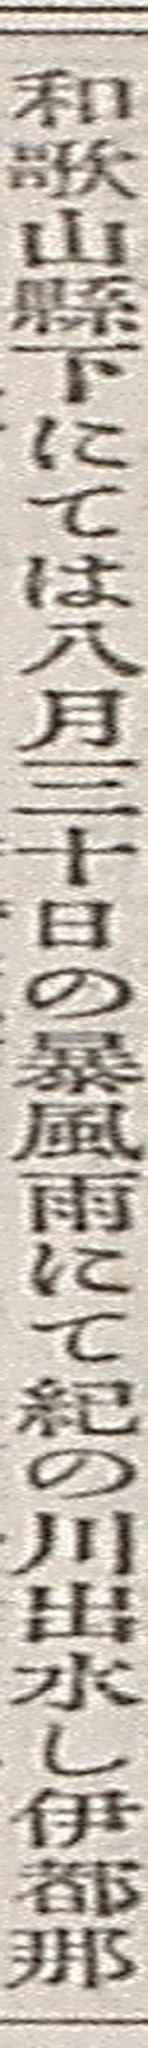和歌山県下にては八月三十日の暴雨風にて紀の川出水し伊都那
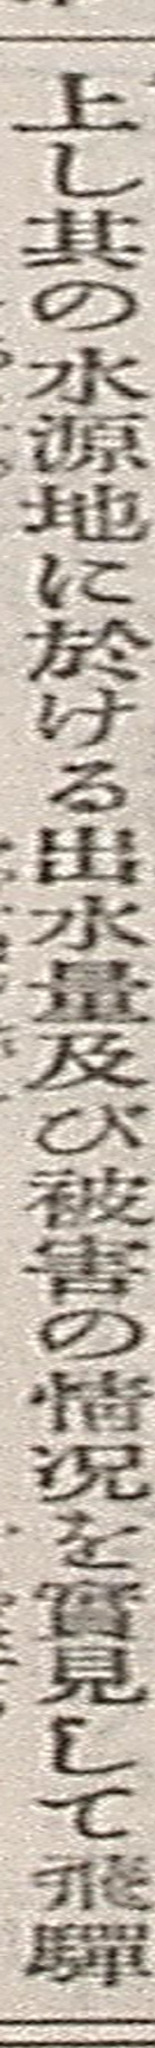上し其の水源地に於ける出水量及び被害の状況を実見して飛騨
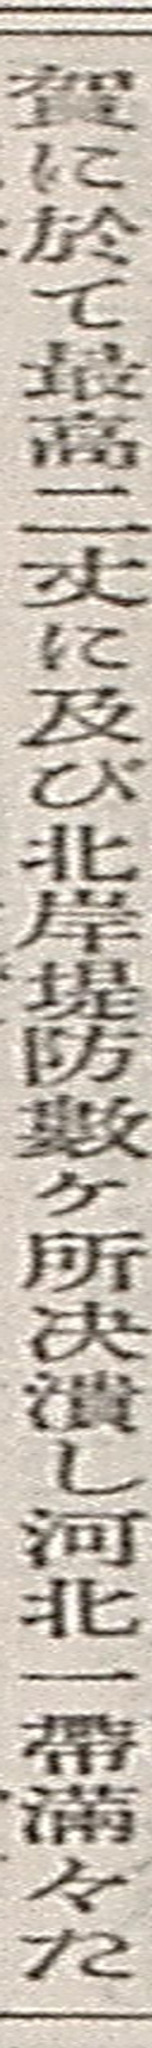賀に於て最高二丈に及び北岸堤防数ヶ所决潰し河北（かほく
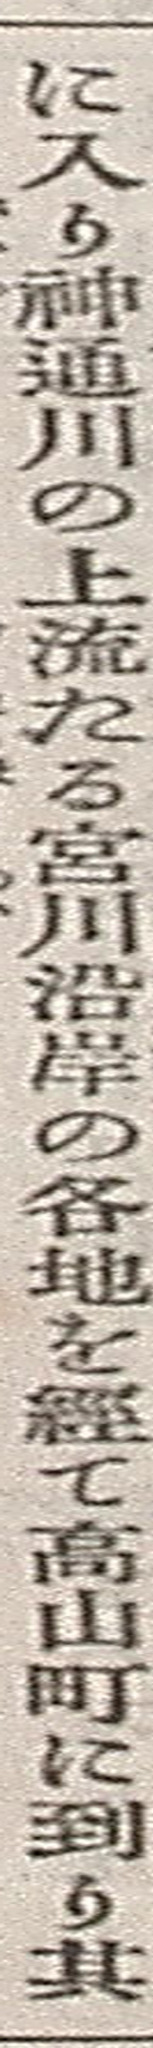に入り神通川の上流たる宮川沿岸の各地を経て高野町に到り其
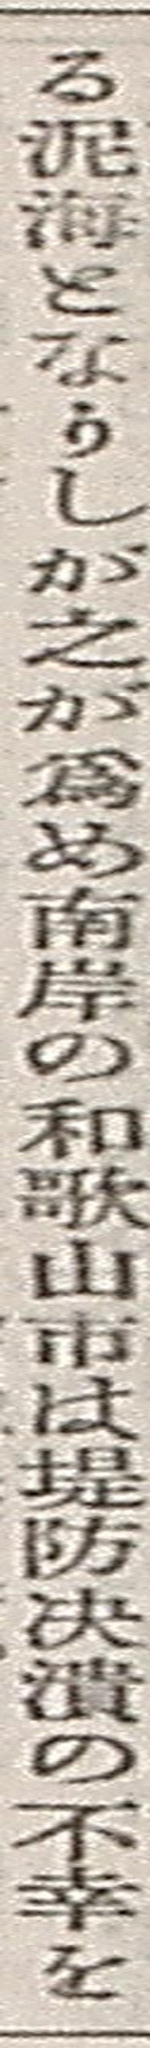る泥海となりしが之が為め南岸の和歌山市は堤防决潰の不幸を
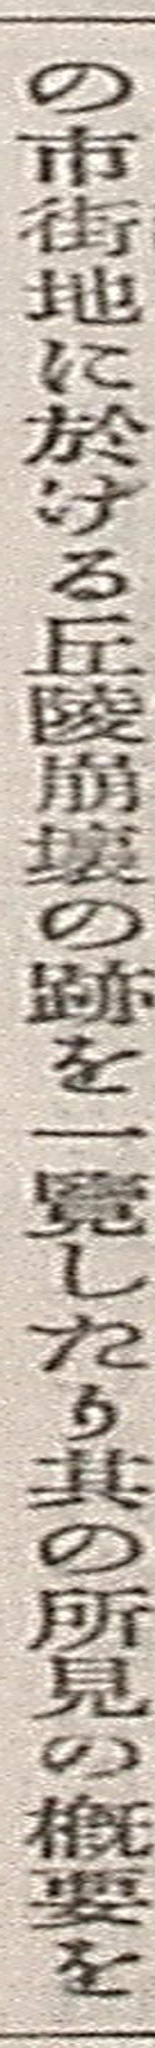の市街地に於ける丘陵崩壊の跡を一覧したり其の所見の概要を
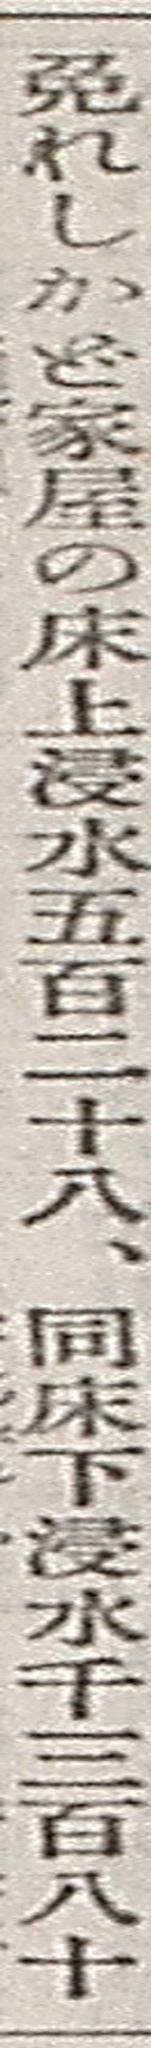免れしかど家屋の床上浸水五百二十八、同床下浸水千三百八十
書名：風俗畫報臨時増刊第百二十八號　洪水被害録（下）
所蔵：東京大学地震研究所図書室 Earthquake Research Institute Library, The University of Tokyo, JAPAN
